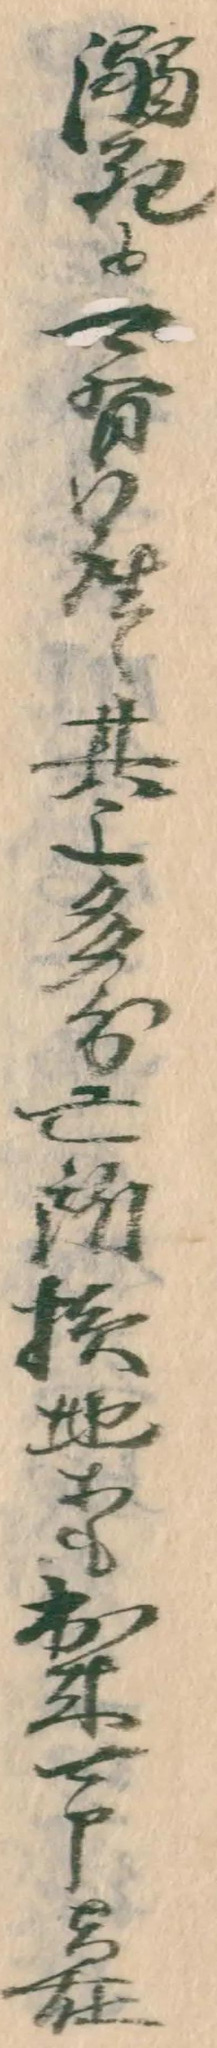溺死も可有御座候其上多分亡所損地等も出来可申旨在
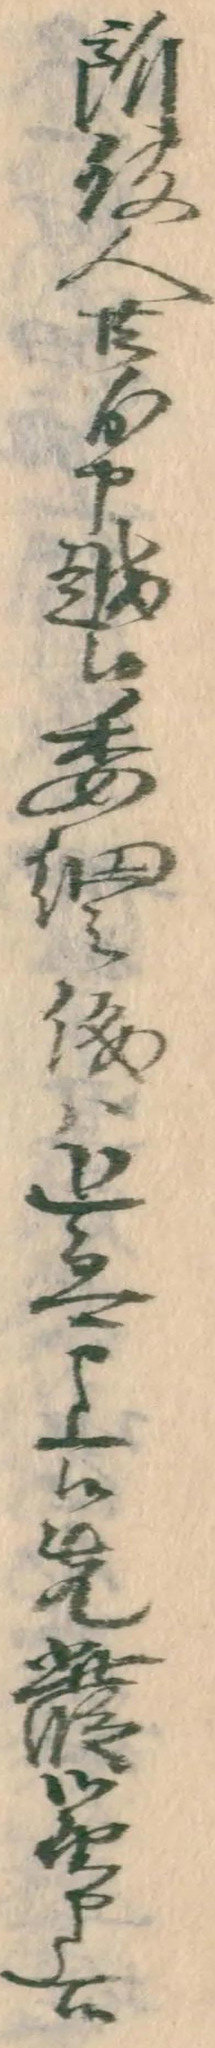所役人共ゟ申越候委細之儀ハ追而可申上候先此段御届申上候
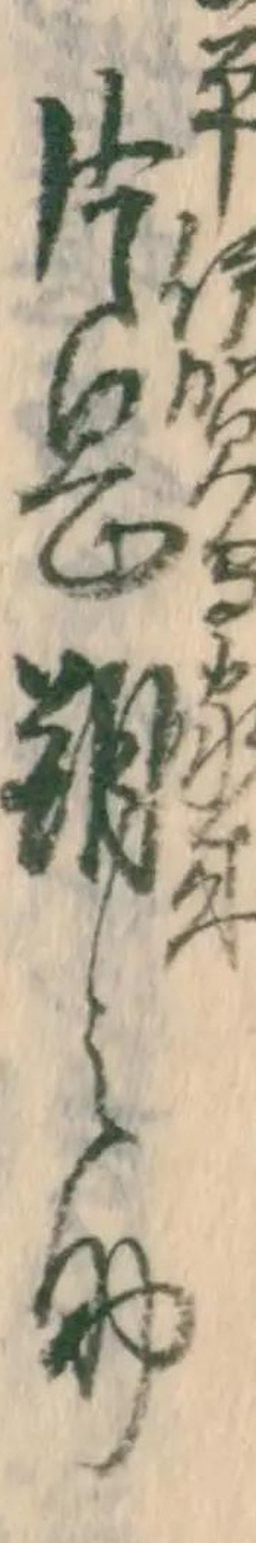片岡朔之助

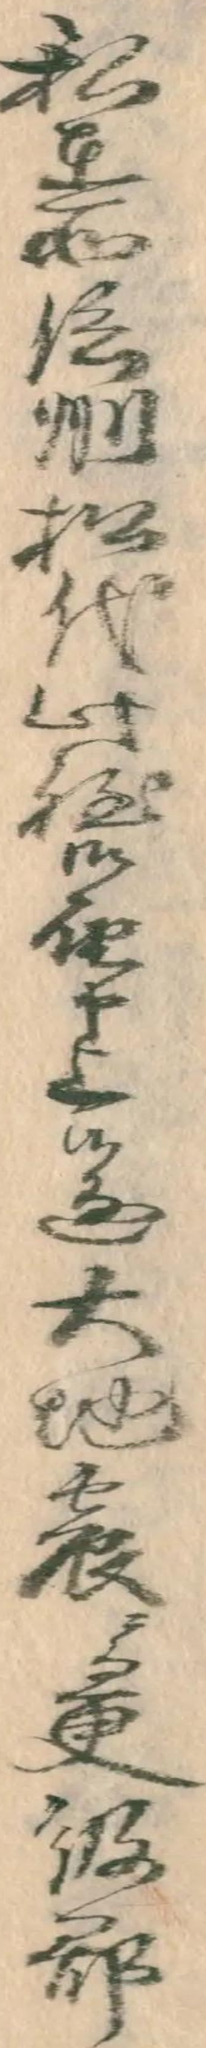私在所信州松代此程先御届申上候通大地震ニ而更級郡
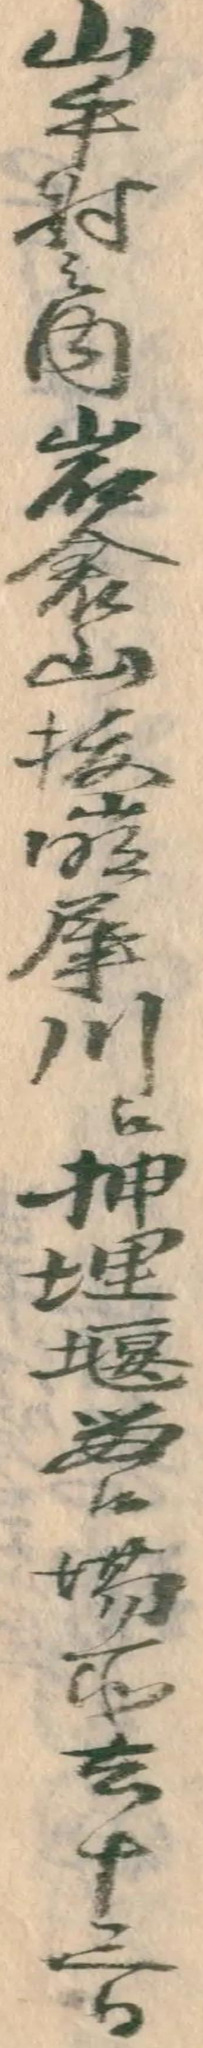山平林村之内岩倉山抜崩犀川江押埋堰留候場所去十三日
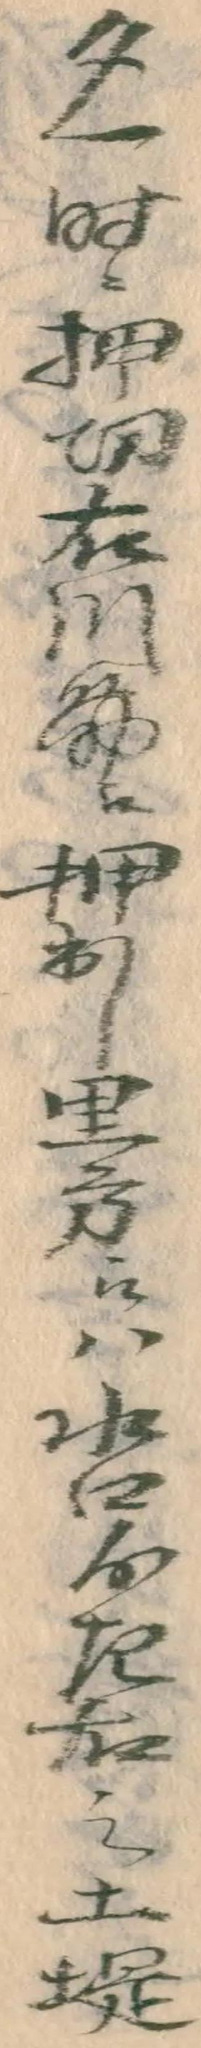夕一時ニ押切右川筋江押出し里方江ハ水口ゟ左右之土堤
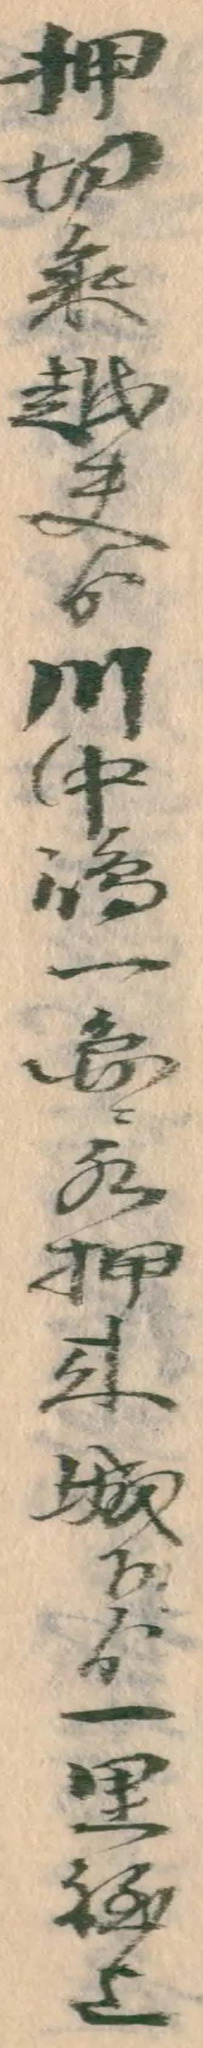押切乗越夫ゟ川中島一円水押来城下ゟ一里程上
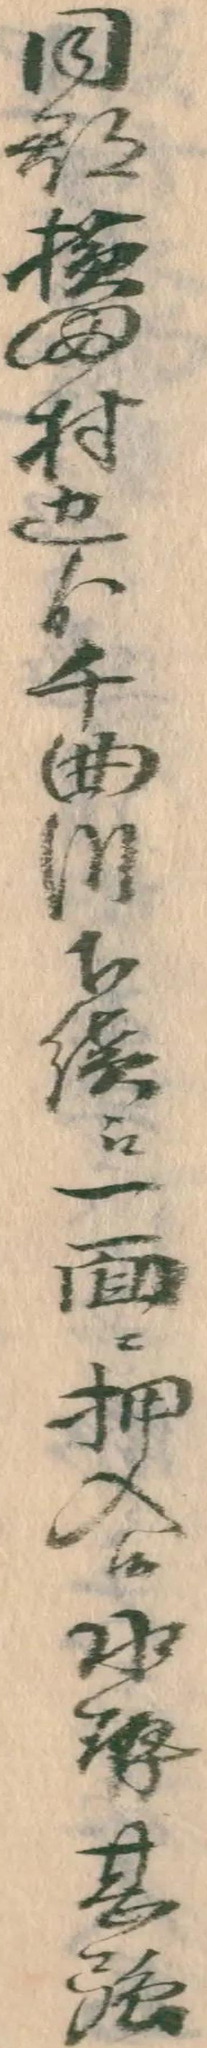同郡横田村辺ゟ千曲川下続江一面ニ甚押入候水勢強
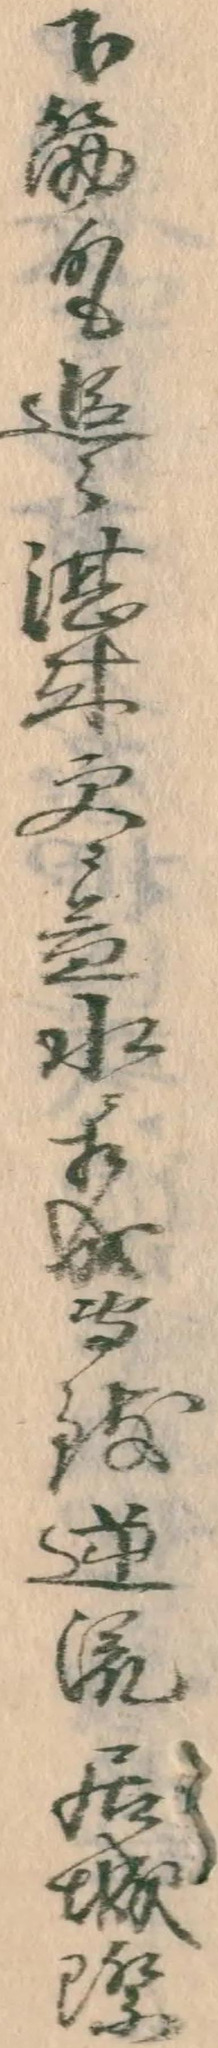下筋ゟも追々湛来更二溢水ニ相成処致逆流居城際
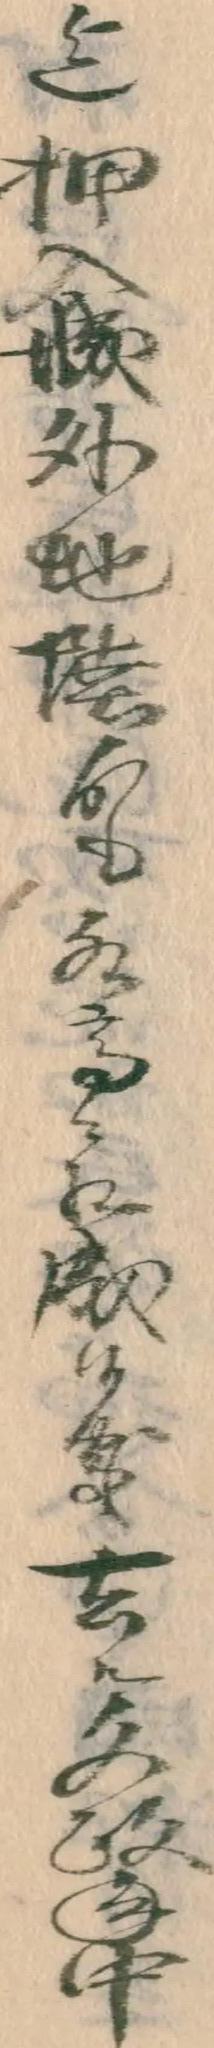迄押入城外地陸ゟも水高ニ相成候処去ル文政年中
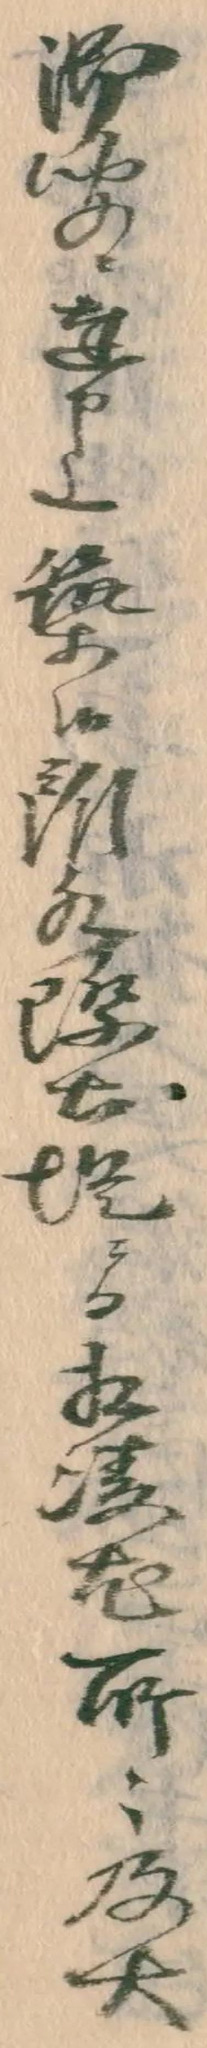御聞二達申上築候所水除土堤ニ而相凌尤所々及大
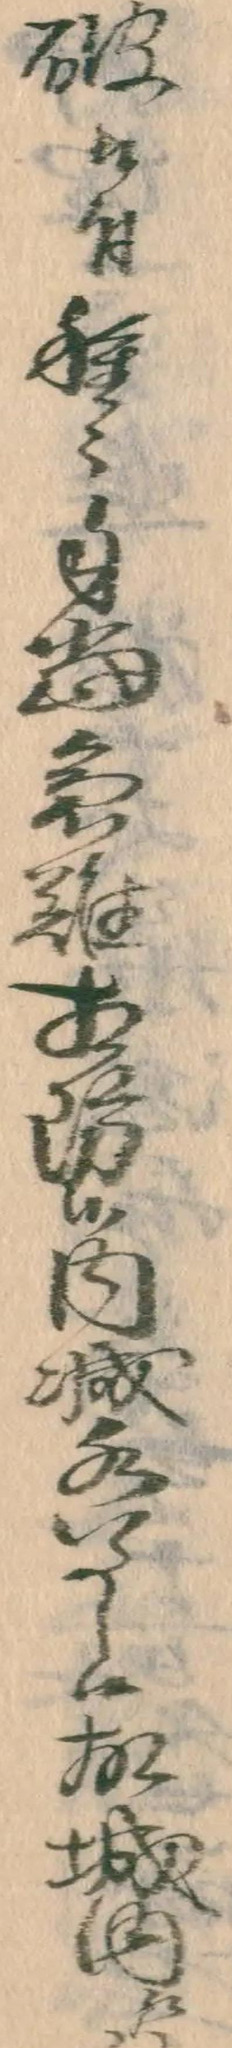破候付種々手当急難相防候内減水いたし候故城内江ハ
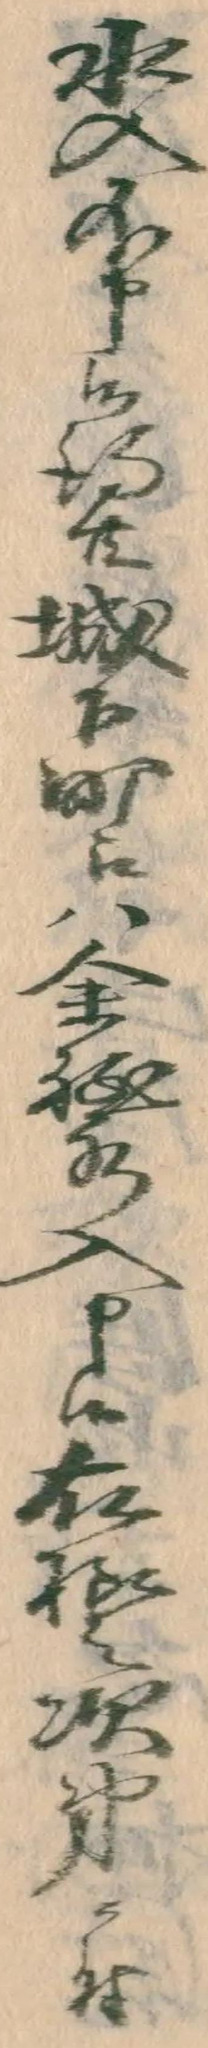水入不申候得共城下町江ハ余程水入申候右様之次第ニ付
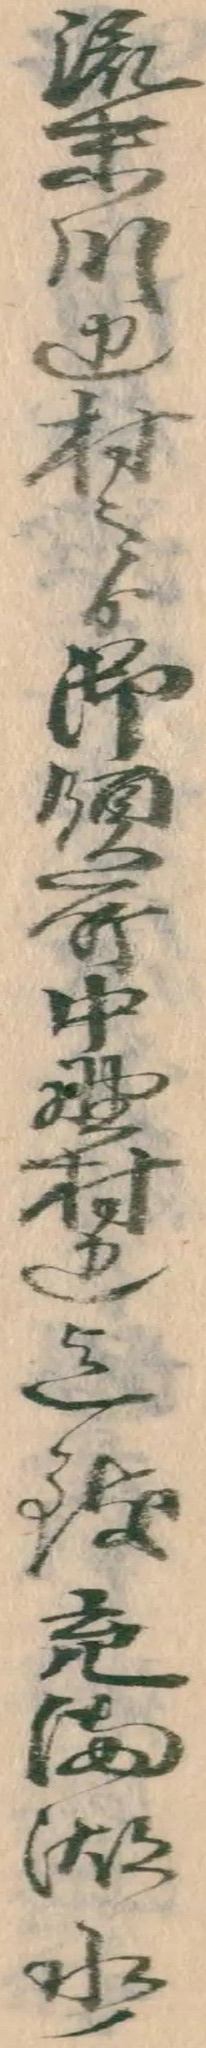流末川辺村々ゟ御領所中野村辺迄致充満湖水ノ
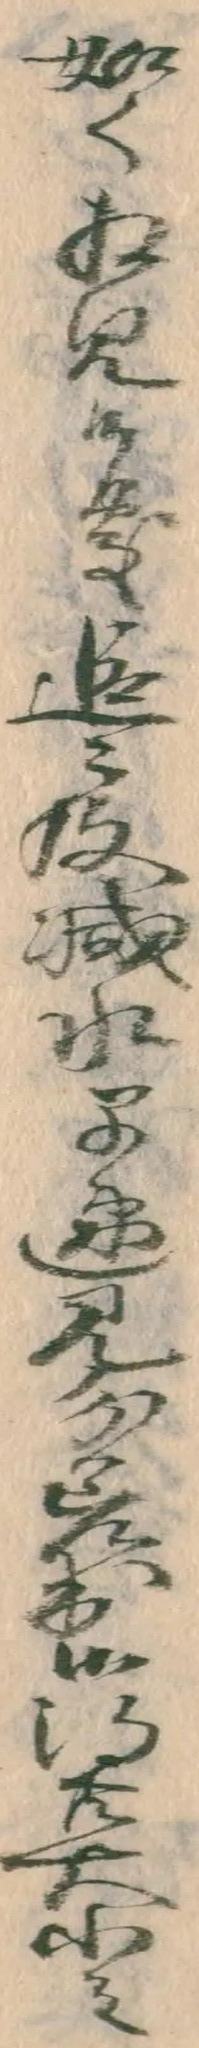如く相見候処追々及減水早速見分差出候得共大小之
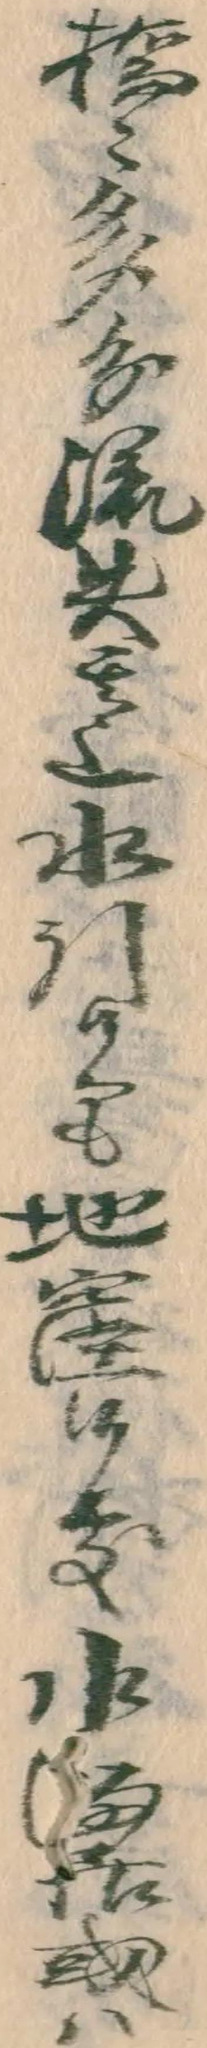橋々多分流失其上水引候而も地窪候処水溜居或ハ
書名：信州大地震之記
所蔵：国立国会図書館 National Diet Library, JAPAN
